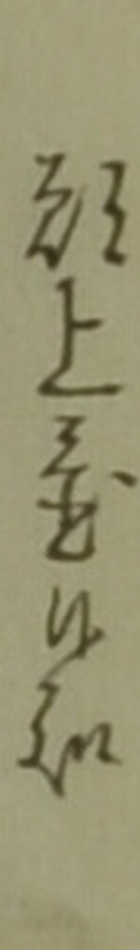願上置候処
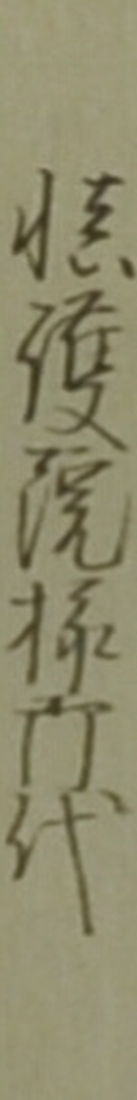慎護院様御代
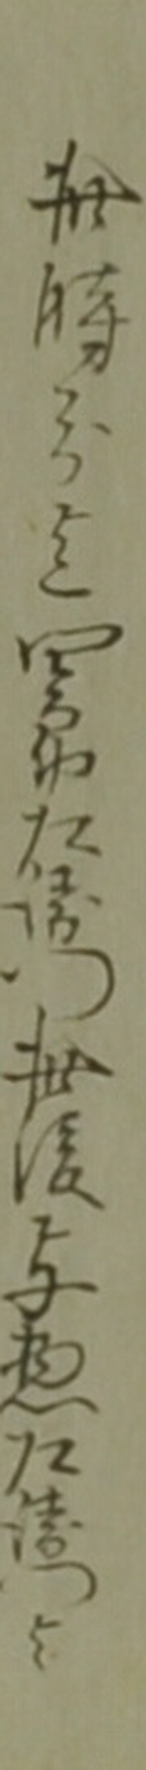此時分迄岡助左衛門此後与惣左衛門与
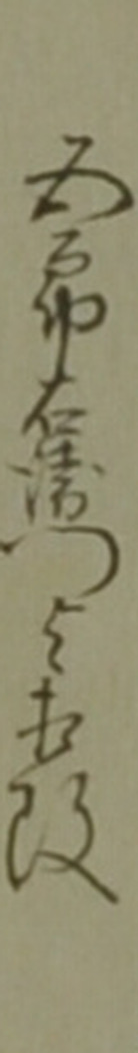五郎右衛門与相改
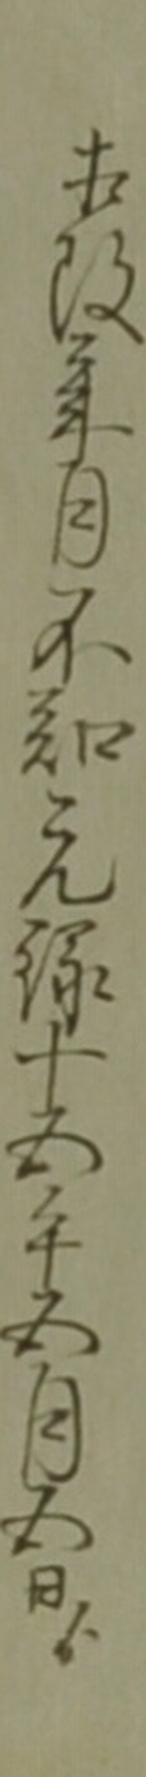相改年月不知元禄十五年五月五日ゟ
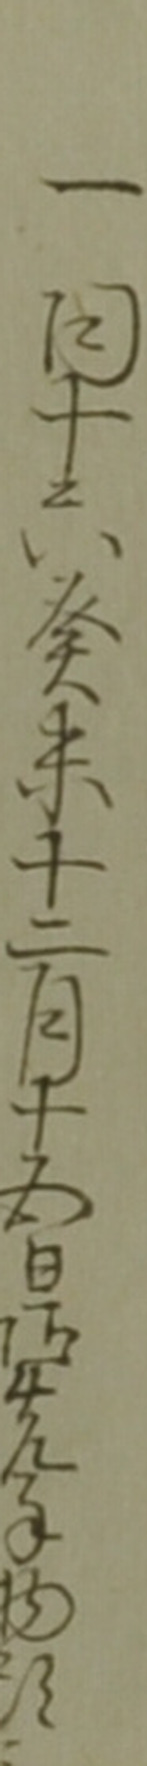一同十六癸未十二月十五日御先手物頭被
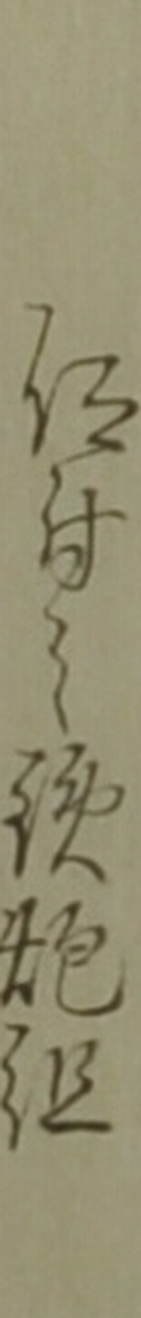仰付之鉄炮組
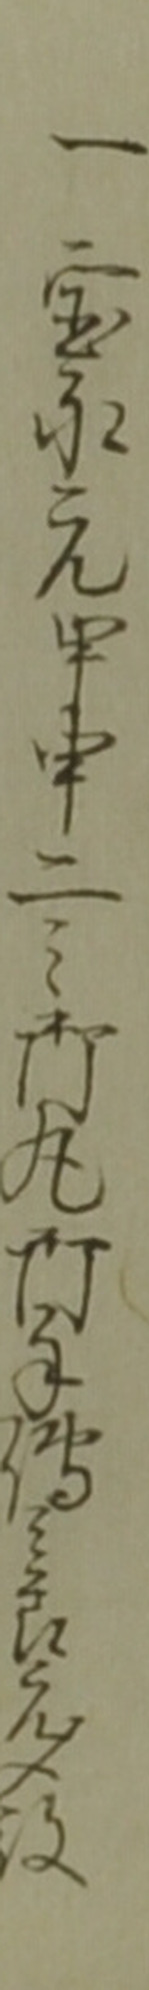一宝永元甲申二之御丸御手伝之節元〆役
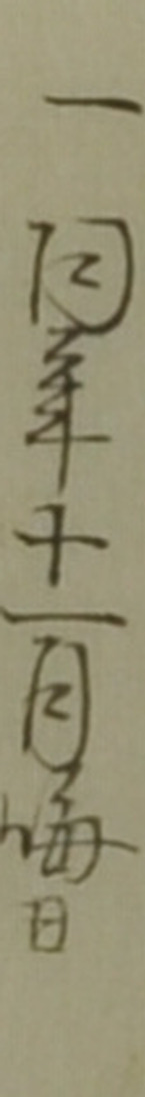一同年十一月晦日
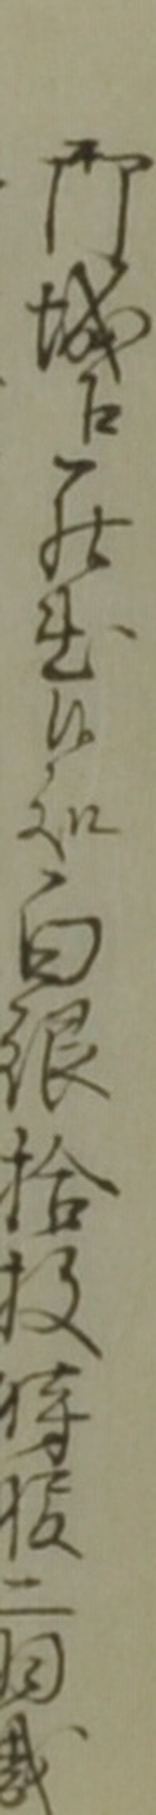御城江罷出候処白銀拾枚時服二羽織
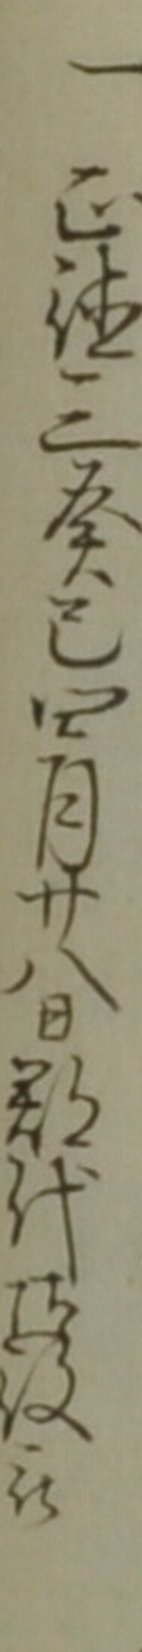一正徳三癸巳四月廿八日郡代御役被
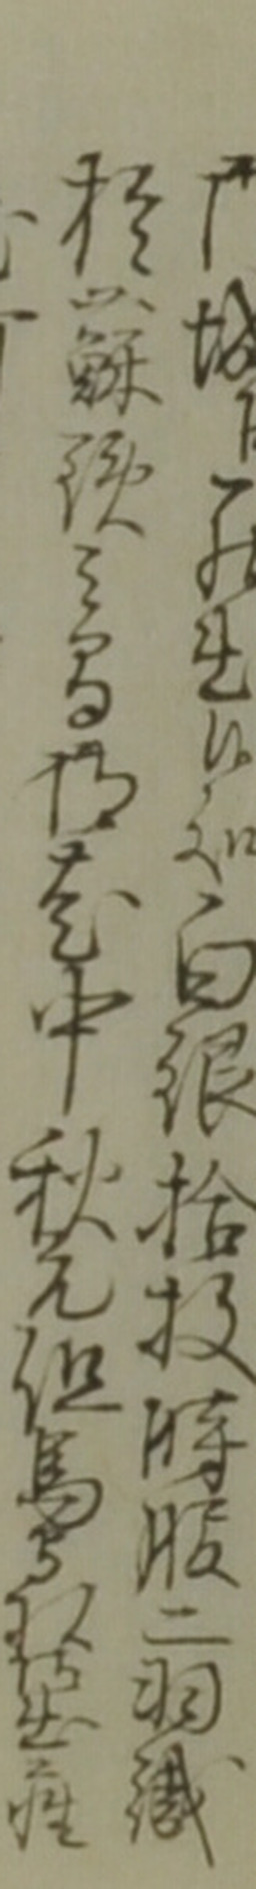於蘇鉄之間御老中秋元但馬守様御出座
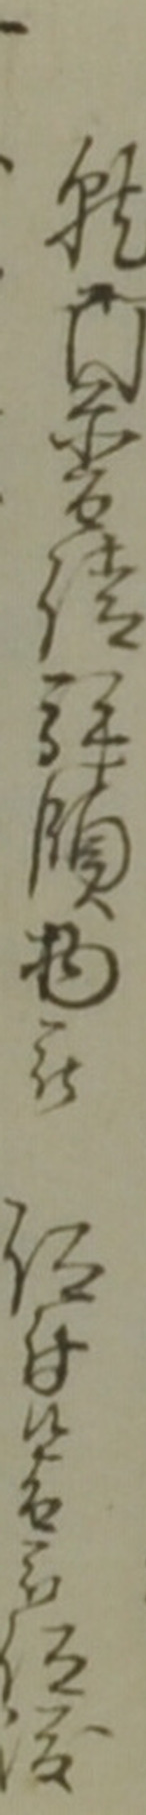就御普請拝領物被仰付候旨被仰渡
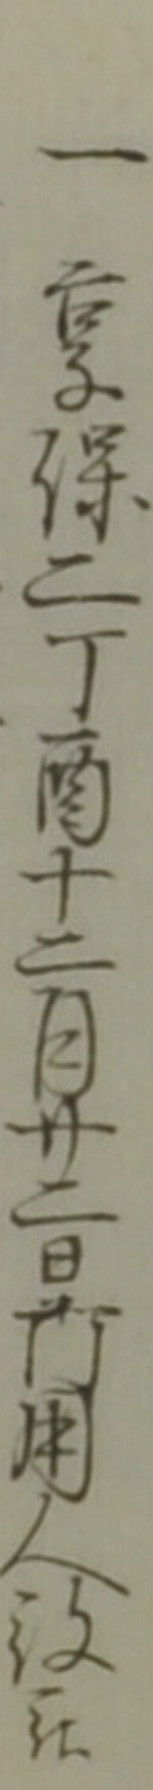一享保二丁酉十二月廿二日御用人役被
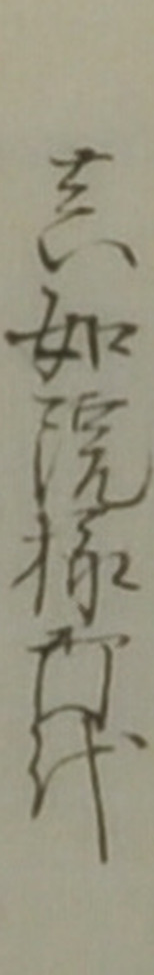真如院様御代
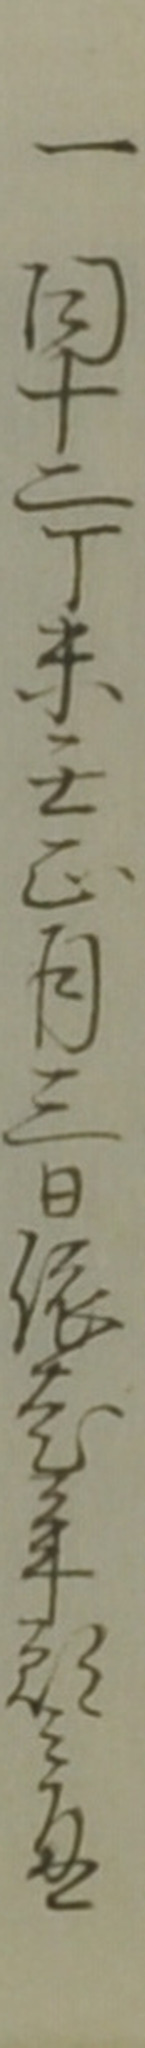一同十二丁未閏正月三日依老年願之通
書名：給人諸士勤仕録（三）
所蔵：伊那市立高遠町図書館・合同会社AMANE
